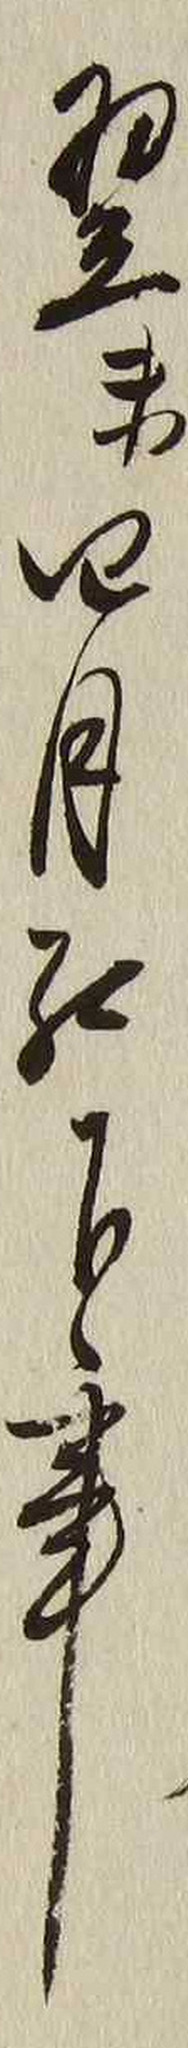翌未四月罷下候事
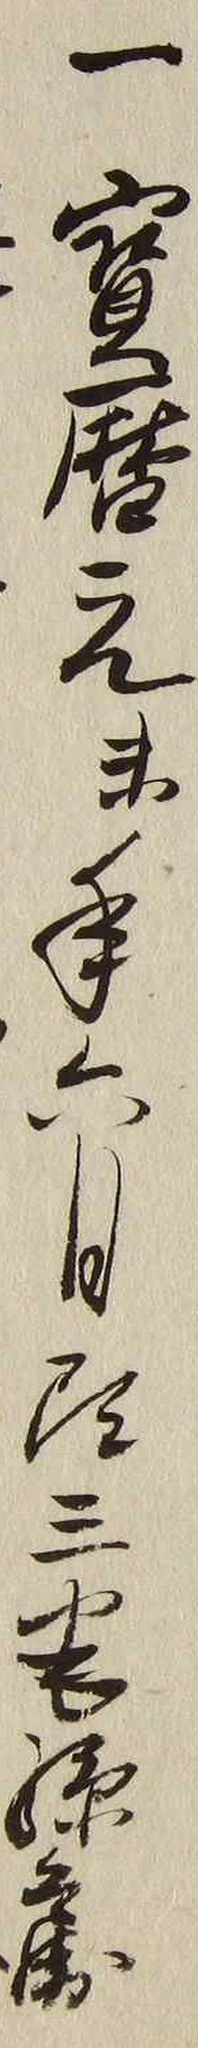一宝暦元未年六月頭三宅孫兵衛
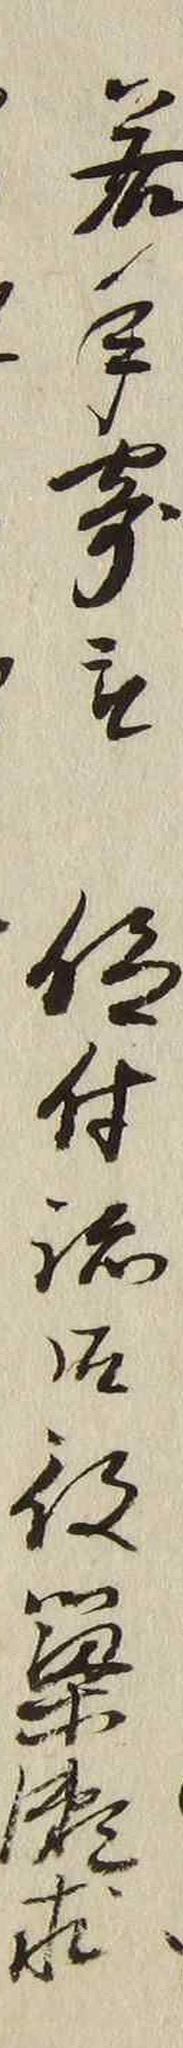若年寄被仰付跡御役簗瀬求
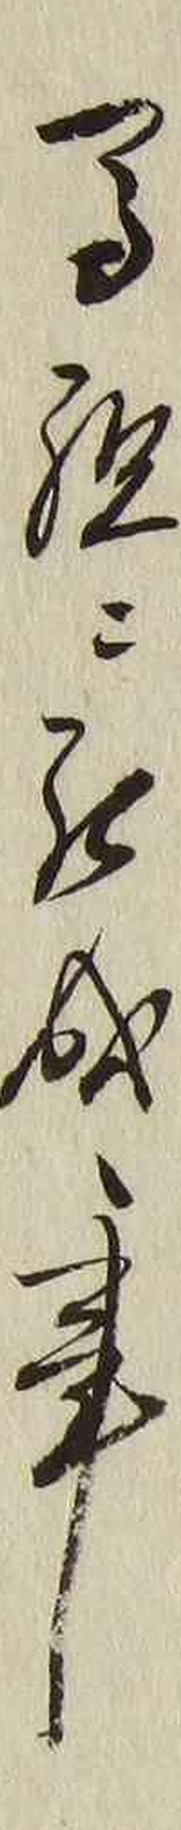馬組ニ罷成候事
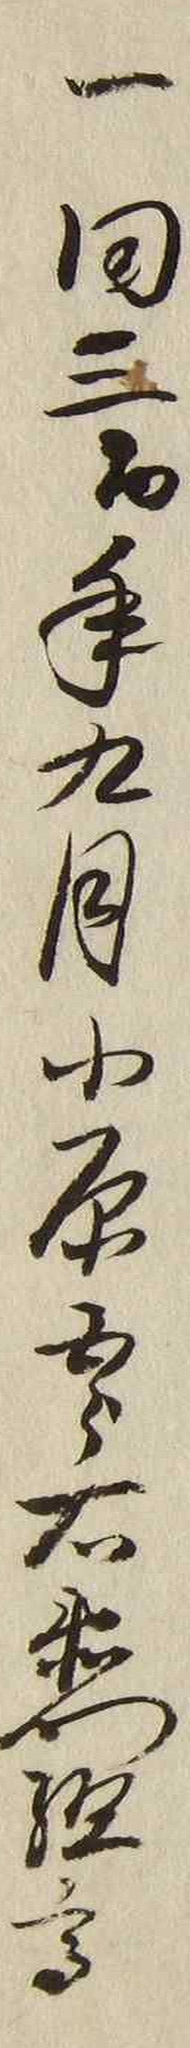一同三酉年九月小原五郎右衛門組高

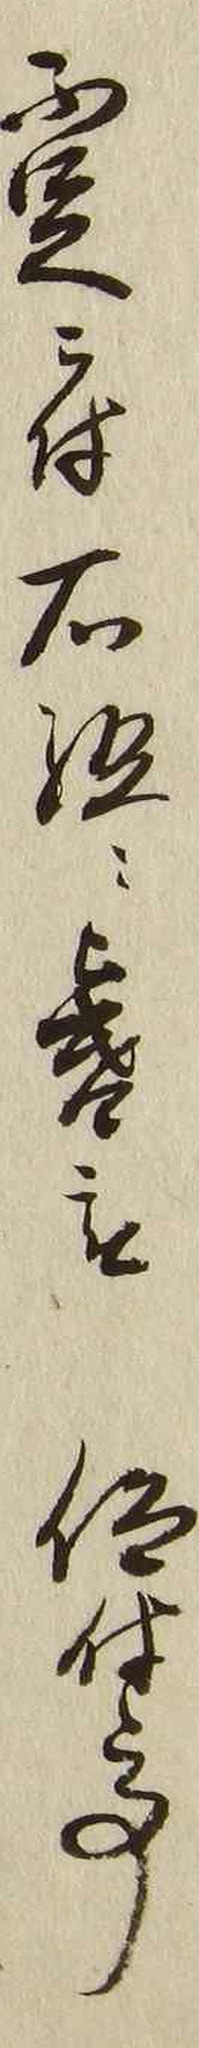不足ニ付右組ニ被替被仰付候事
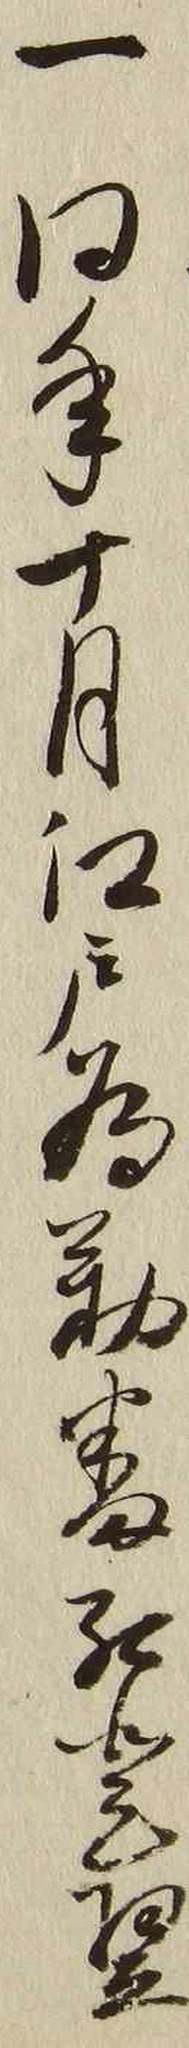一同年十月江戸為勤番罷登翌
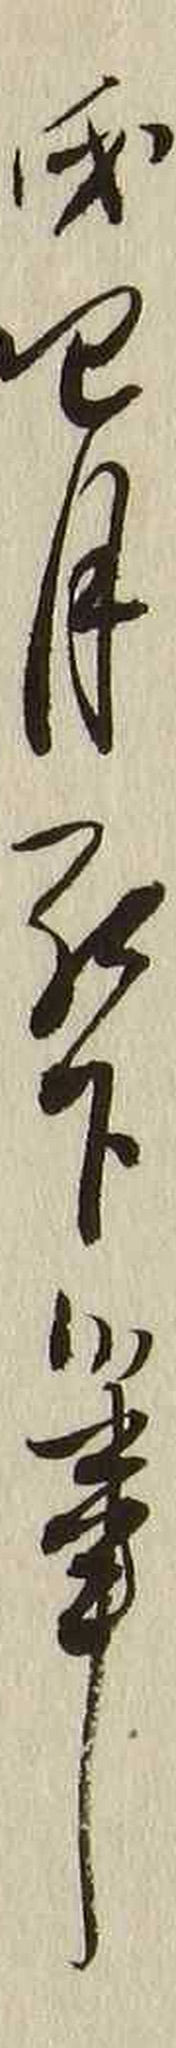戌四月罷下候事
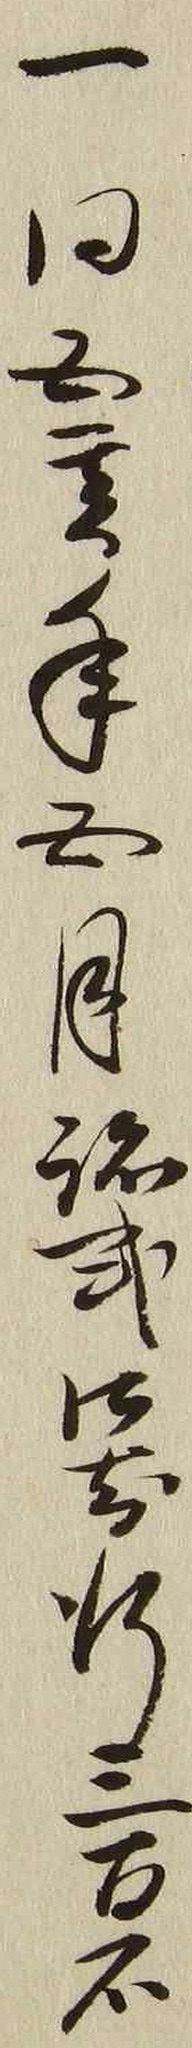一同五亥年五月跡式御知行三百石
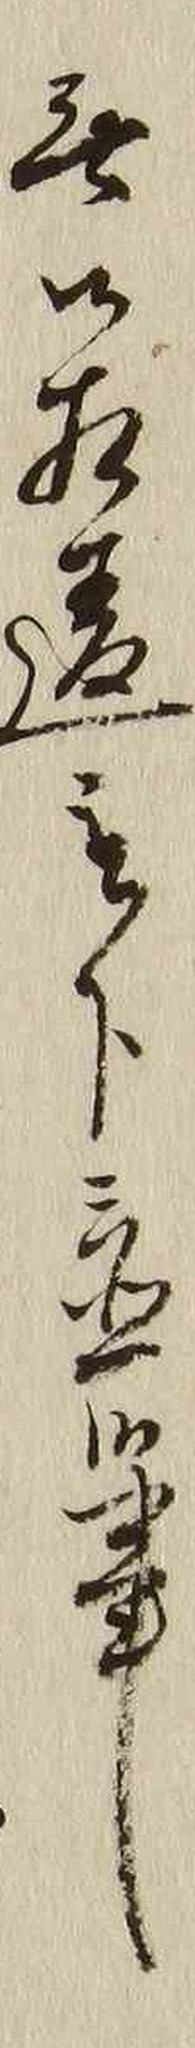無御相違被下置候事
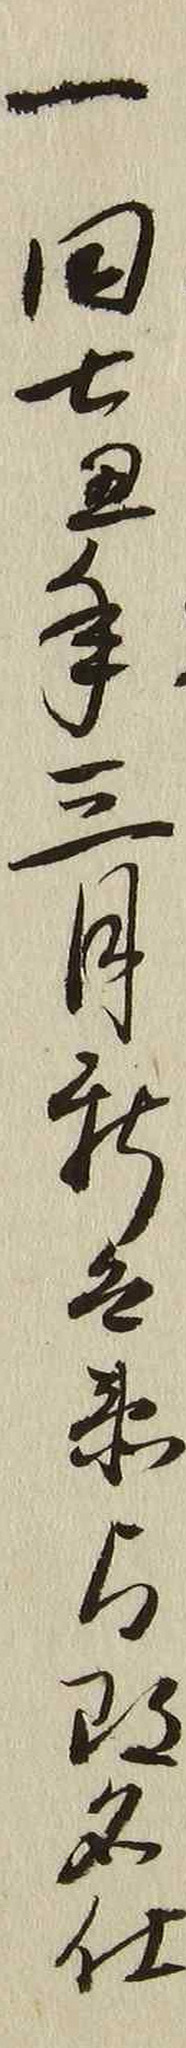一同七丑年三月新兵衛与改名仕
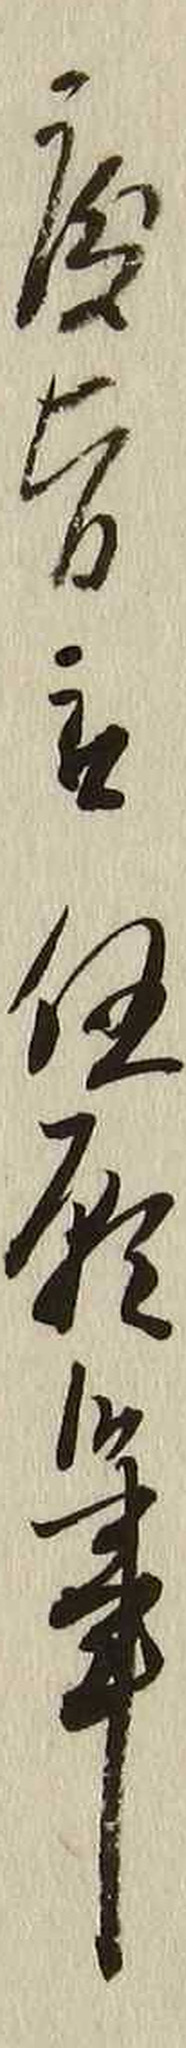度旨被任願候事
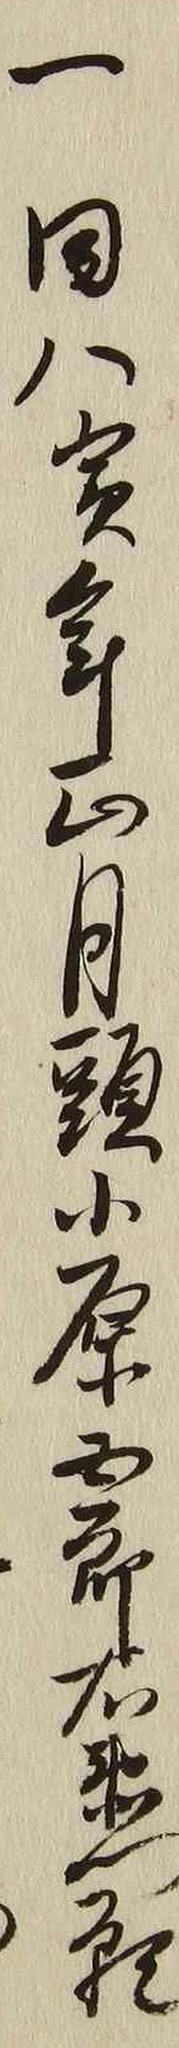一同八寅年正月頭小原五郎右衛門願
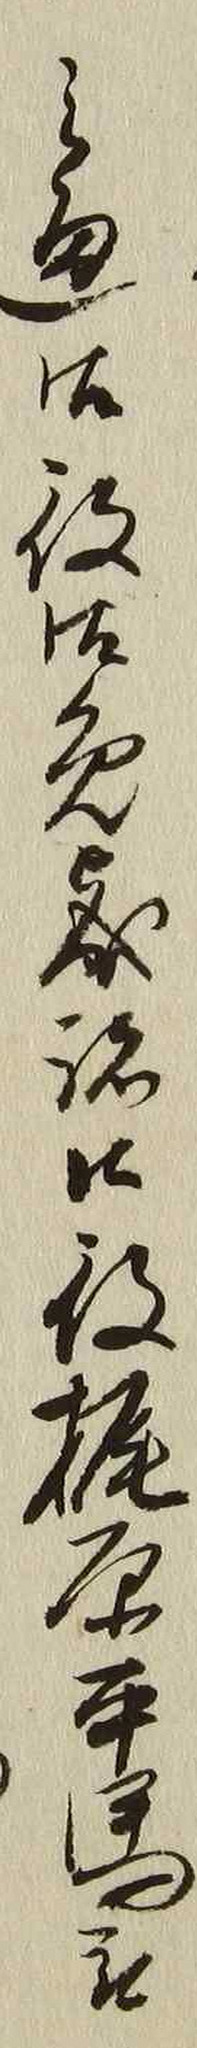之通御役御免被成跡御役梶原平馬被
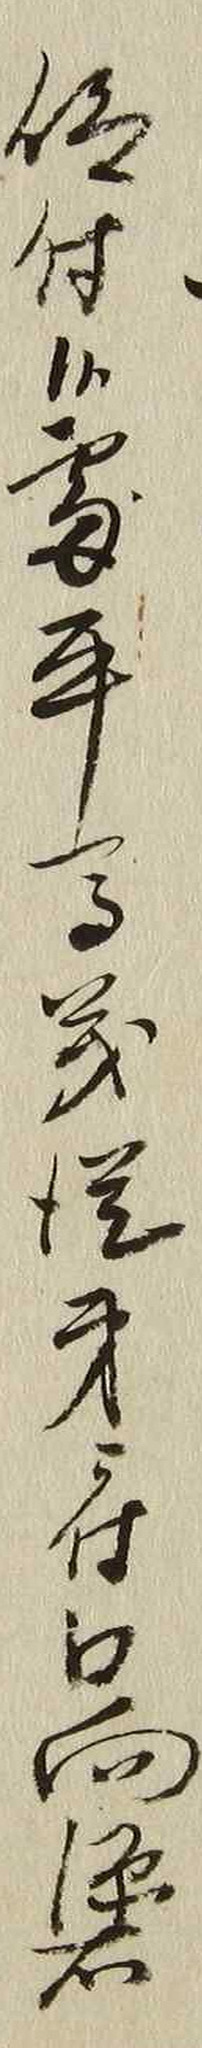仰付候処平馬義従弟ニ付日向源右
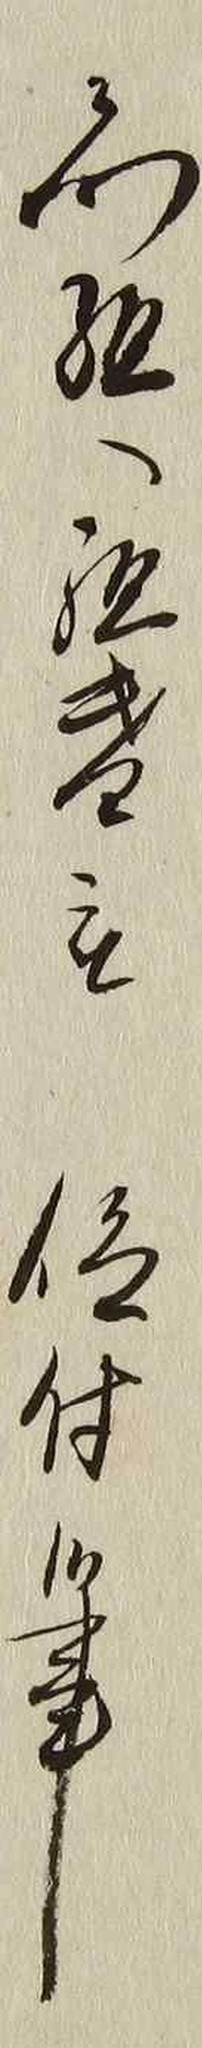衛門へ組替被仰付候事
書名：諸士系譜　巻之348　も之部4
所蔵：会津若松市立会津図書館
